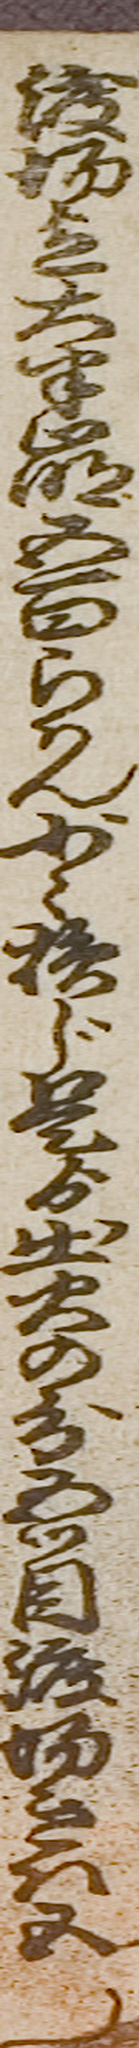渡場迄大半崩五百らかん少々損じ是ゟ出火の分五ツ目渡場きは五
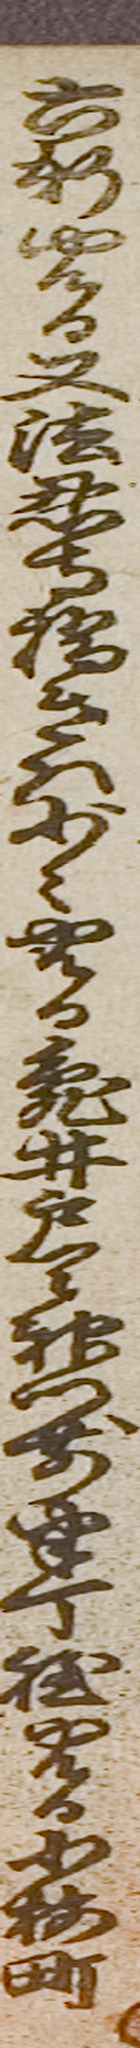六軒やける又法恩寺橋きは少々やける亀井戸天神門前半丁程やける小梅町
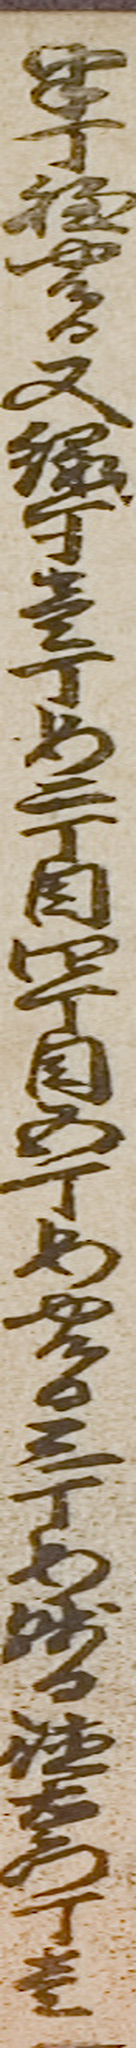半丁程やける又緑丁壱丁め二丁目四丁目五丁めやける三丁め残る徳右衛門丁壱
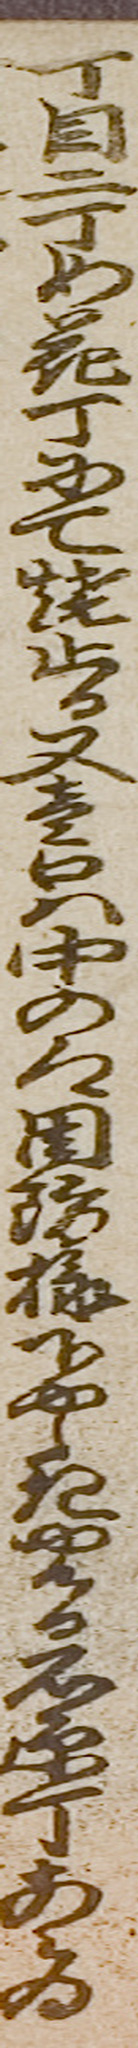丁目二丁め花丁にて焼止る又壱口は中の郷周防様下やしきやける石原丁あらゐ
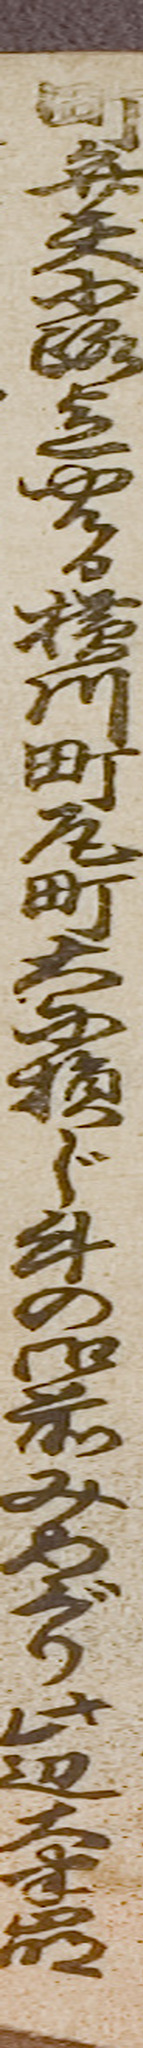町弁天小路迄やける横川町瓦町大に損じ牛の御前みめぐり此辺大半崩
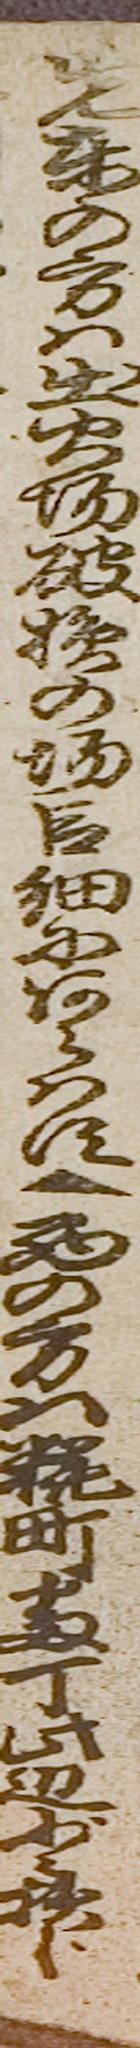先東の方は出火場破損の場巨細にあらはす▲西の方は糀町番丁此辺少々損じ
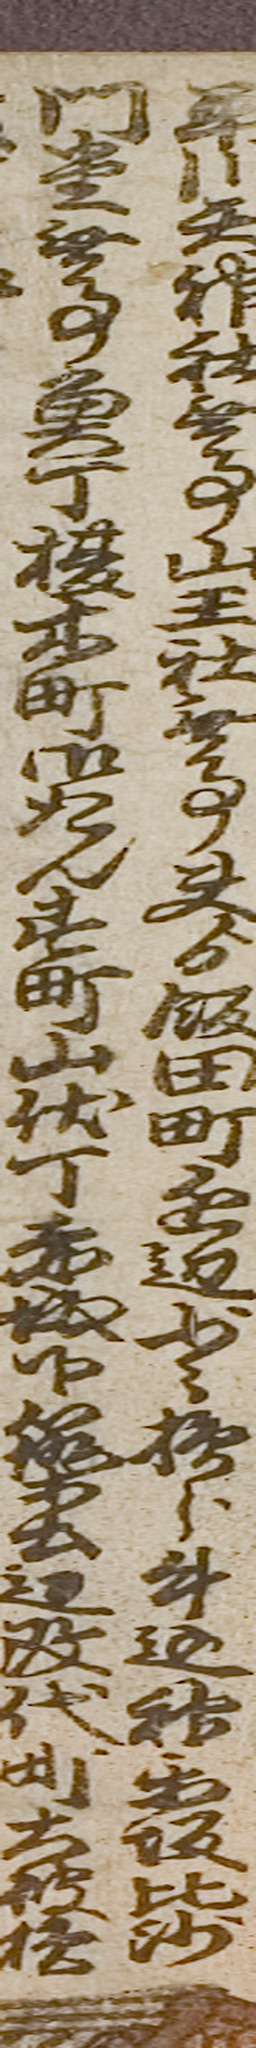門堂無事魚丁榎木町御たんす町山伏丁赤城下築土辺改代町大破損
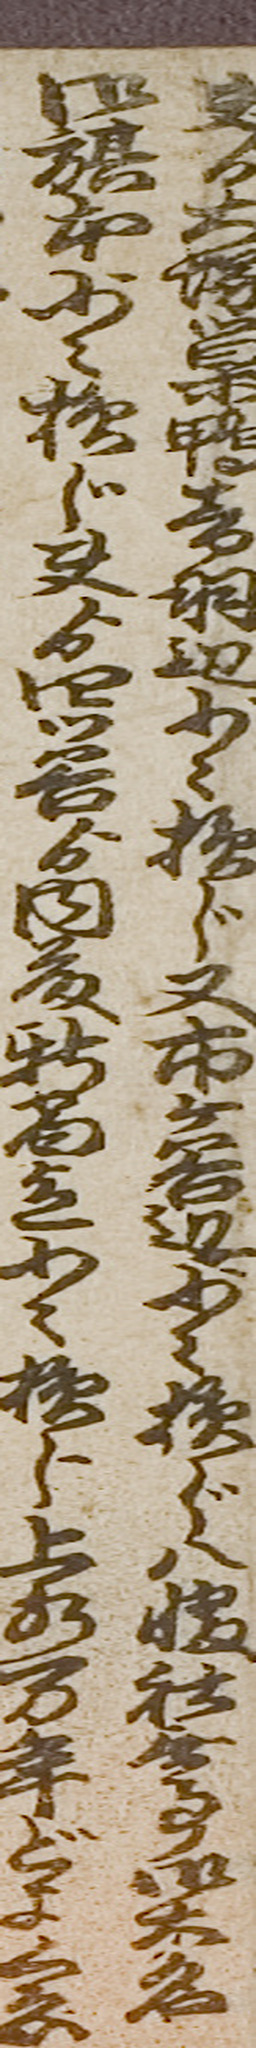御旗本少々損じ夫ゟ四ッ谷ゟ内藤新宿迄少々損じ上水万年どよくゑ
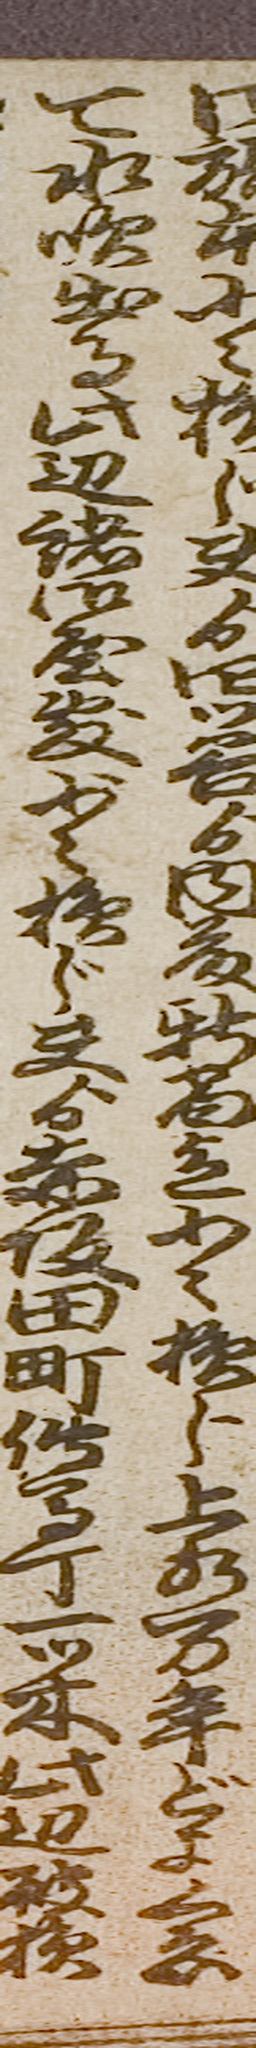て水吹出る此辺諸御屋敷少々損じ夫ゟ赤坂田町伝馬丁一ツ木此辺破損
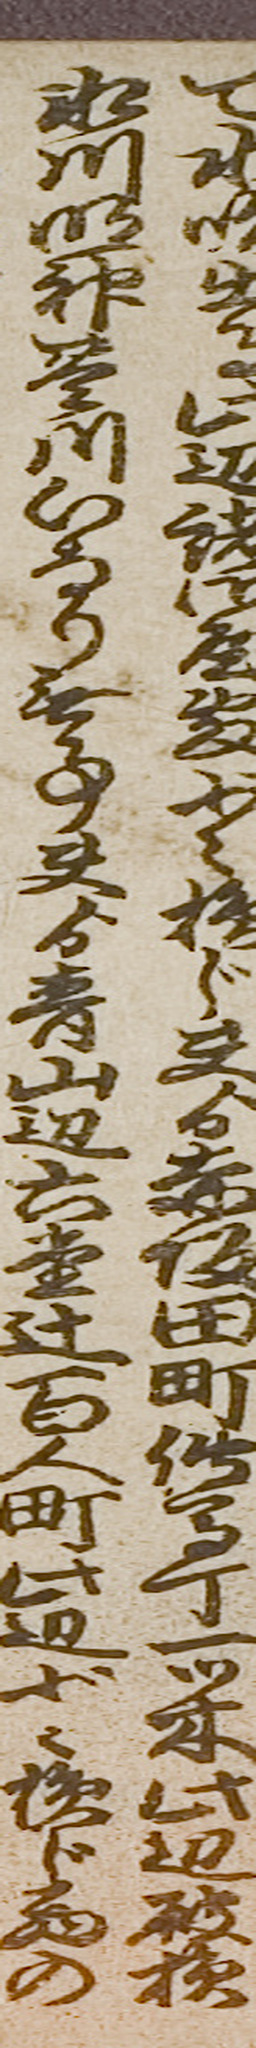氷川明神豊川いなり無事夫ゟ青山辺六堂辻百人町此辺少々損じ西の
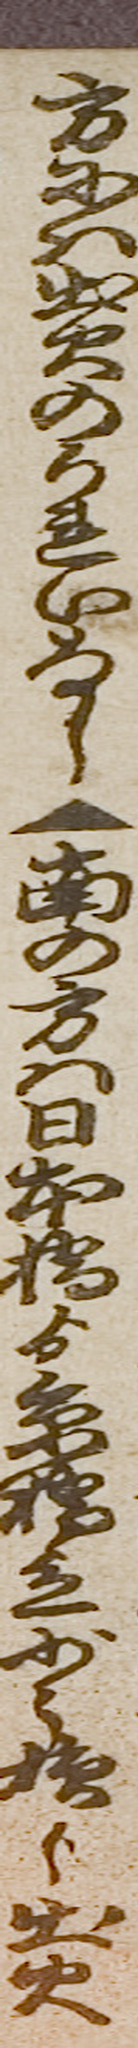方には出火のうれいなし▲南の方は日本橋ゟ京橋迄少々損じ出火
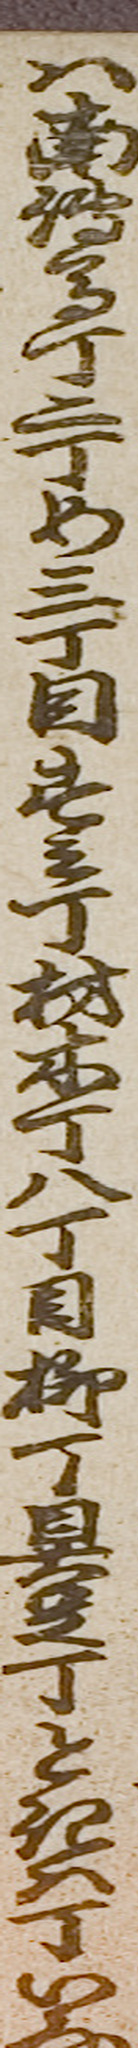は南伝馬丁二丁め三丁目すみ丁材木丁八丁目柳丁具足丁ときは丁いな
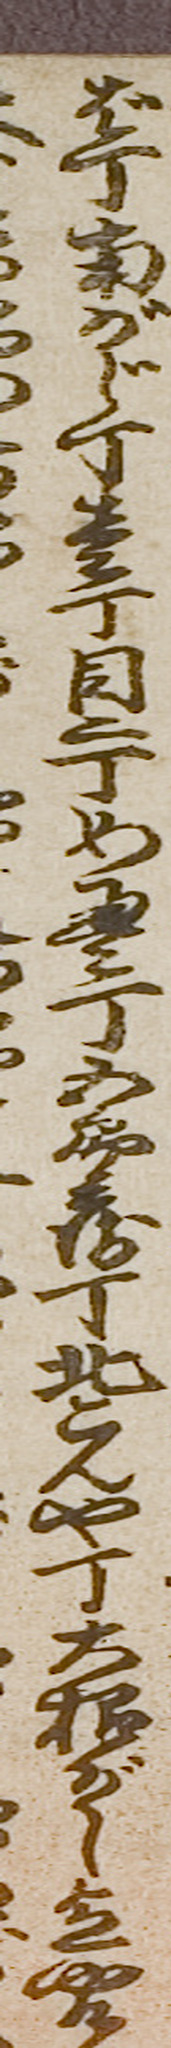ば丁南がじ丁壱丁目二丁め畳丁五郎兵衛丁北こんや丁大根がし迄やける
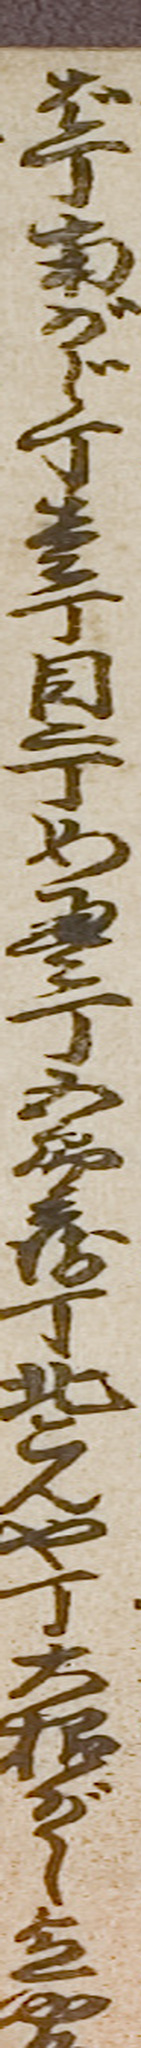ば丁南がじ丁壱丁目二丁め畳丁五郎兵衛丁北こんや丁大根がし迄やける
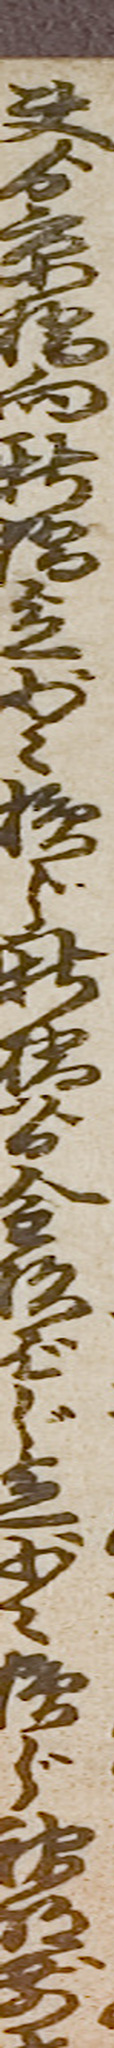夫ゟ京橋向新橋迄少々損じ新橋ゟ金杉ばじ迄少々損じ神明前大半
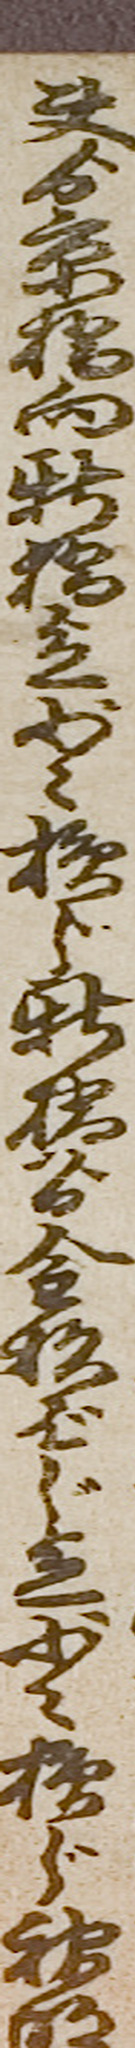夫ゟ京橋向新橋迄少々損じ新橋ゟ金杉ばじ迄少々損じ神明前大半
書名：[安政地震状況図]
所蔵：東京大学総合図書館 General Library in the University of Tokyo, JAPAN
